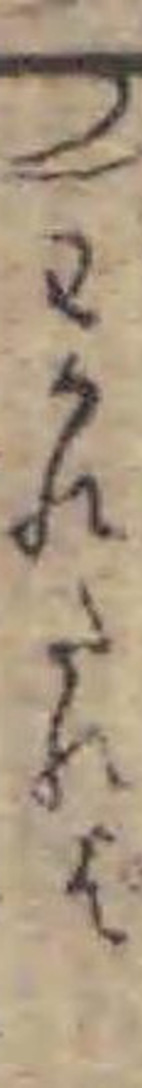わかれたれば
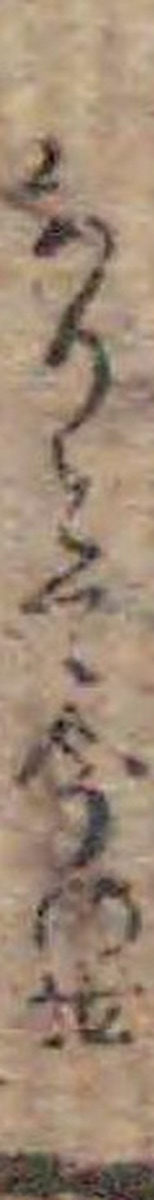なりとて今の世
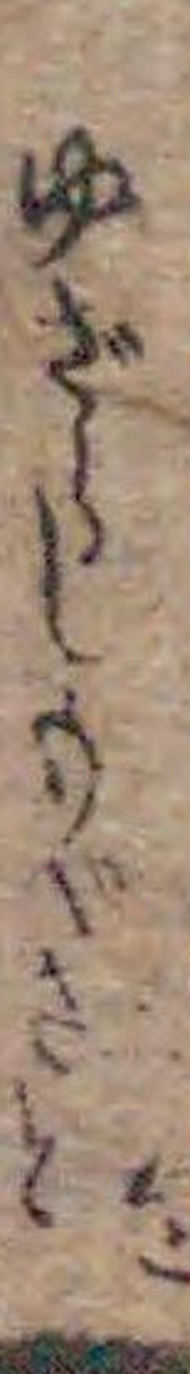ゆざらしもぐさと
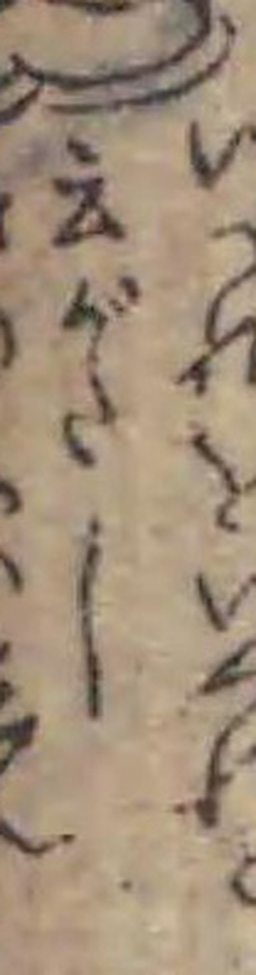云がたし
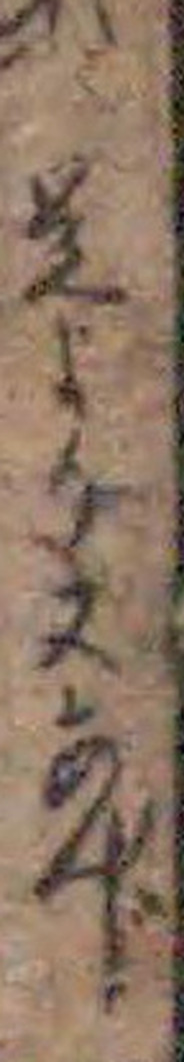是より又あんじ
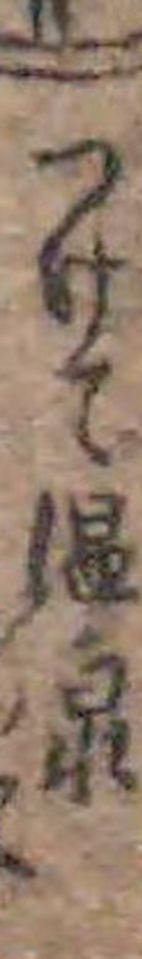つけて温泉
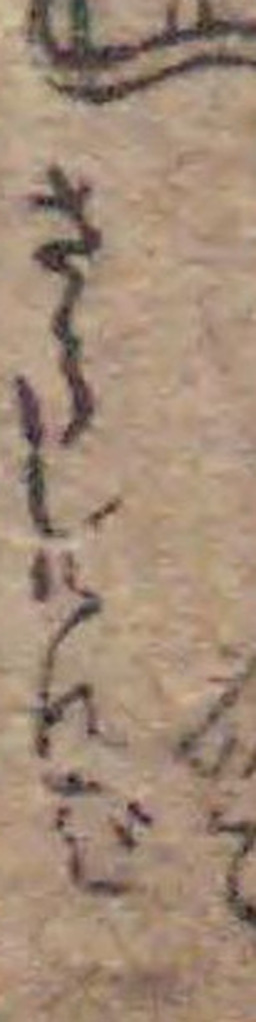さらしければ
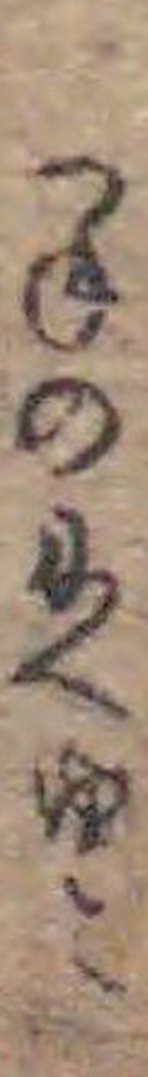つねのにへゆと
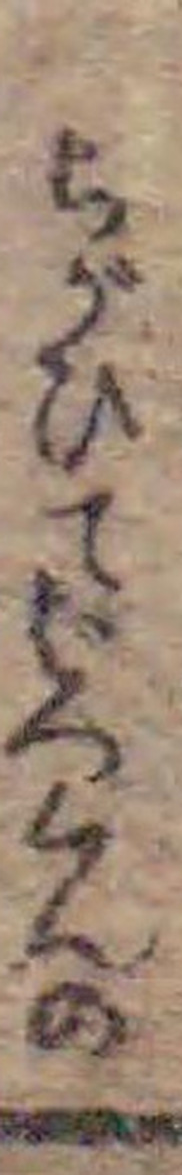ちがひてばつくんの
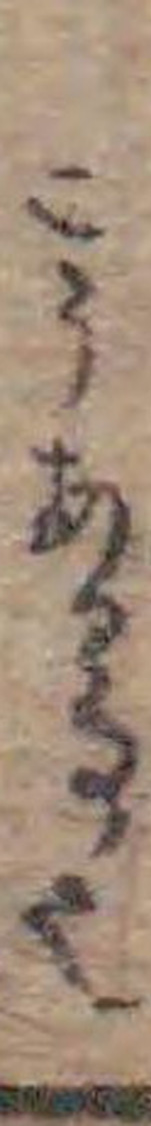こうある事也
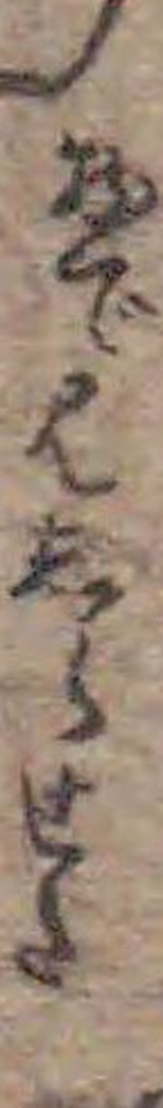物で見しらせた
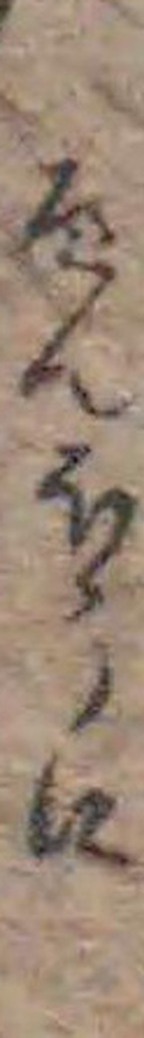へんほうに
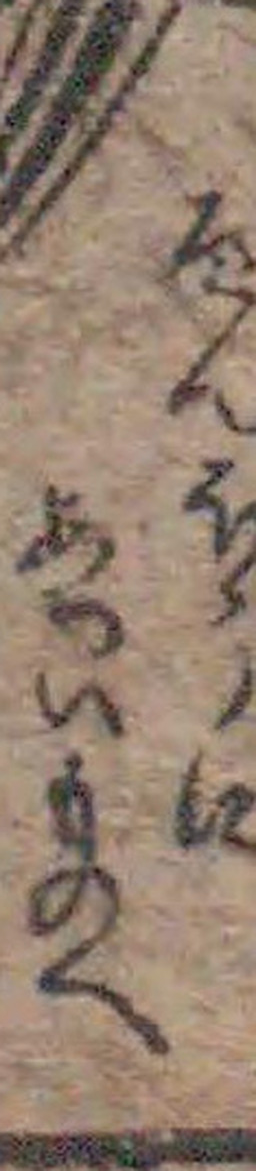あついものへ
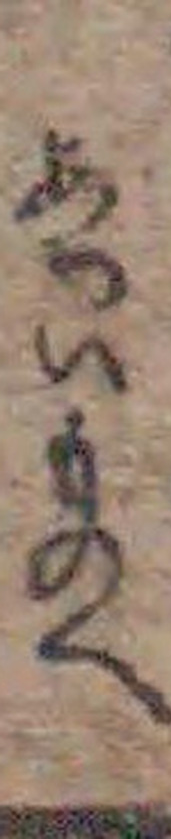あついものへ
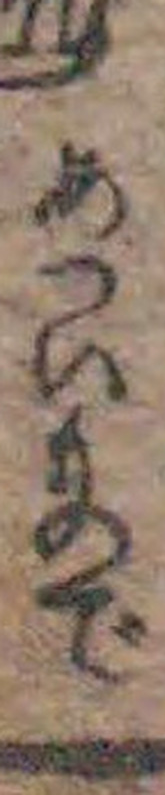あついもので
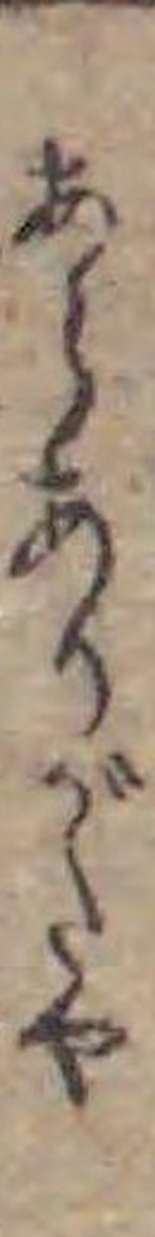あらありがたや
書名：三舛増鱗組 : 3巻
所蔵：国立国会図書館 National Diet Library, JAPAN
